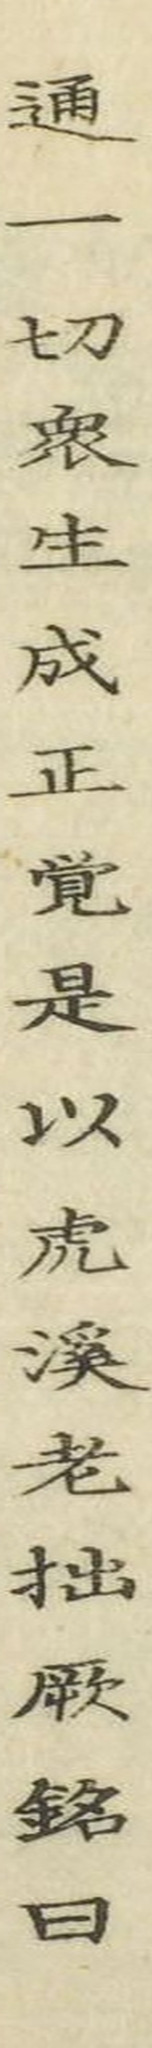通一切衆生成正覚是以虎溪老拙厥銘曰
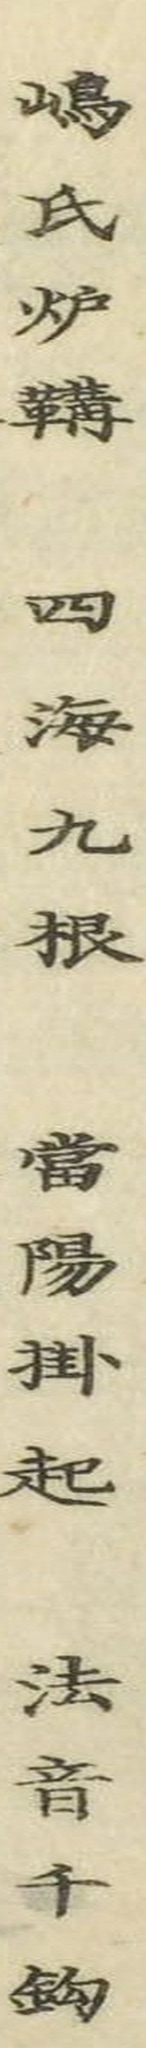嶋氏炉鞲四海九根當陽掛起法音千鈎
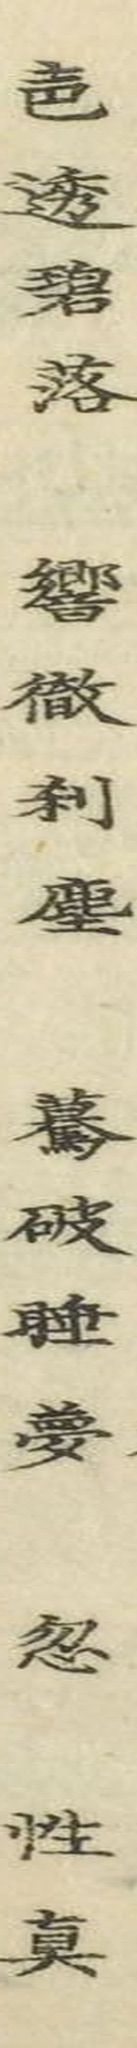声透碧落響徹刹塵驀破睡夢忽性真
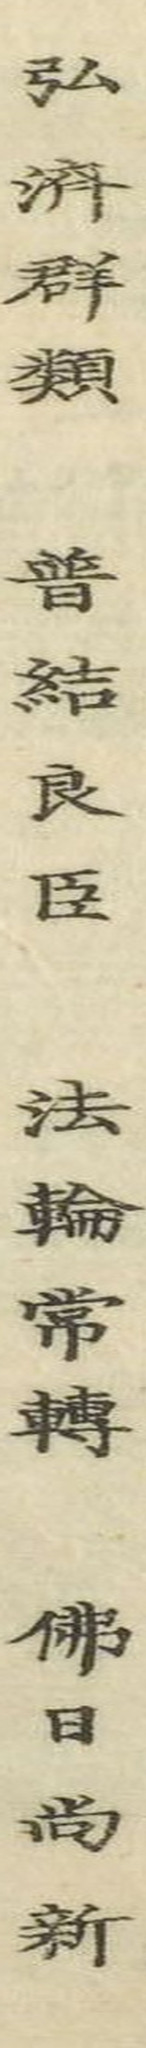弘済群類普結良臣法輪常轉佛日尚新
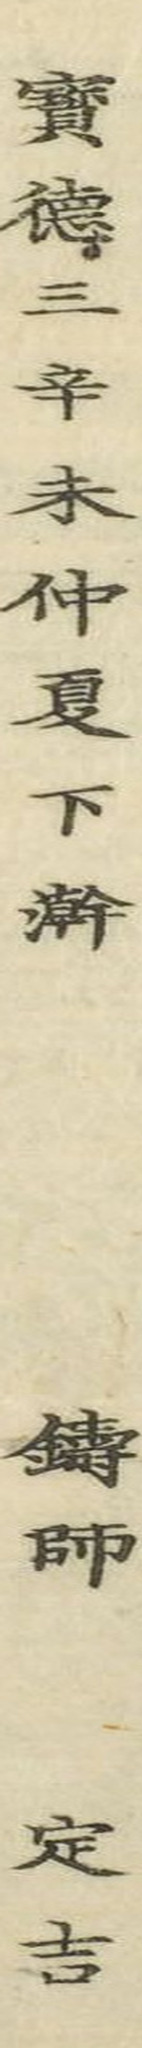寳德三辛未仲夏下澣鑄師定吉
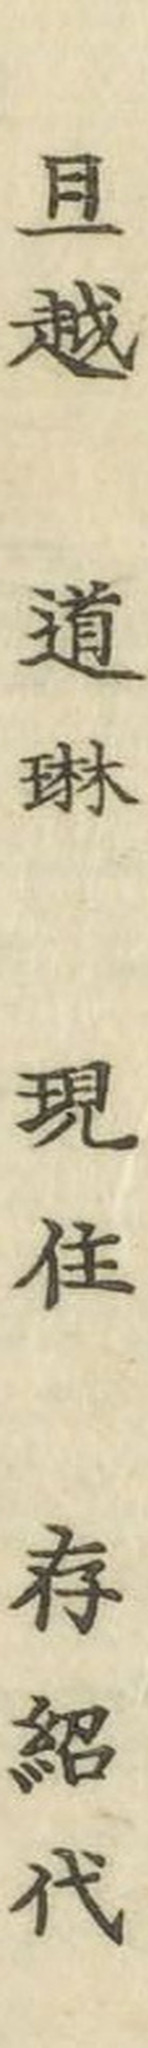旦越道琳現住存紹代
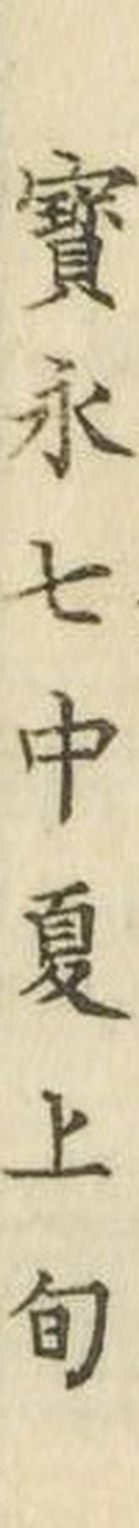寳永七中夏上旬
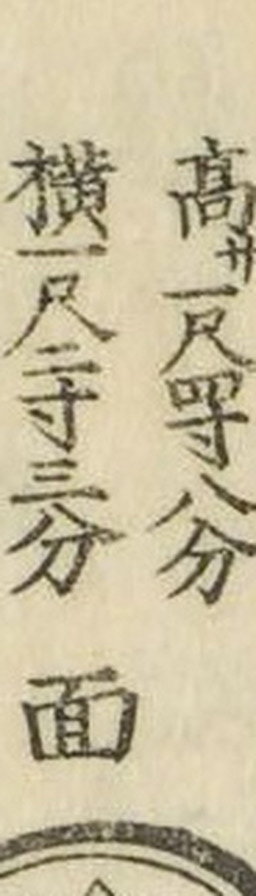横一尺二寸三分
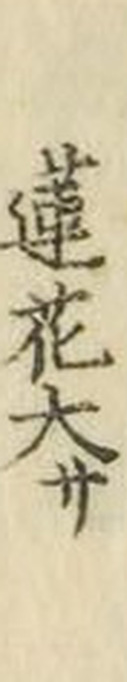蓮花大サ
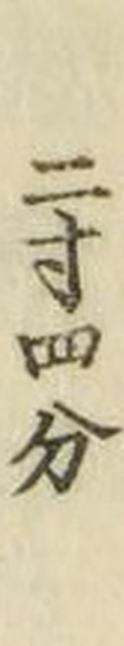二寸四分
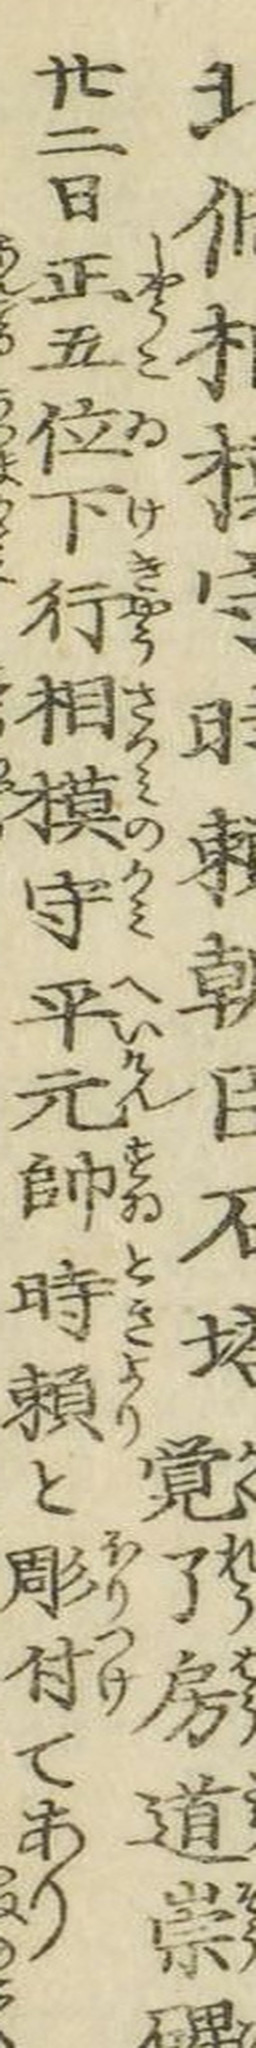廿二日正五位下行相模守平元帥時頼と彫付てあり
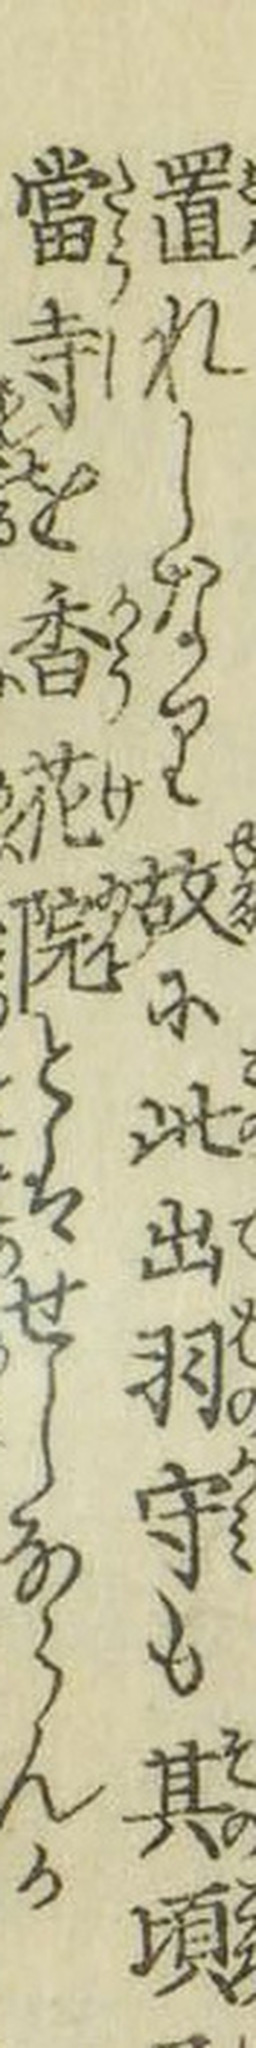當寺を香花院とはせしならんか
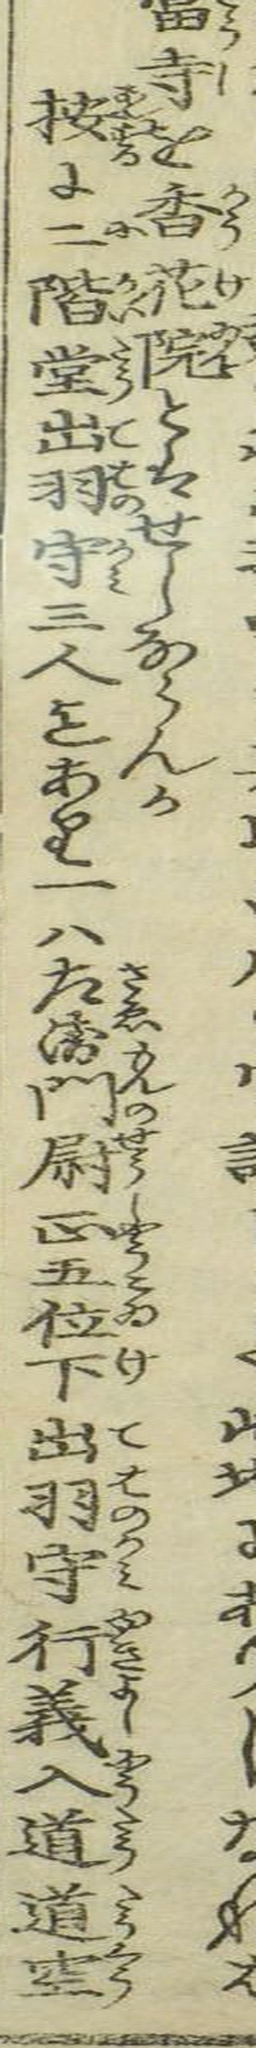按に二階堂出羽守三人迄あり一は左衛門尉正五位下出羽守行義入道道空

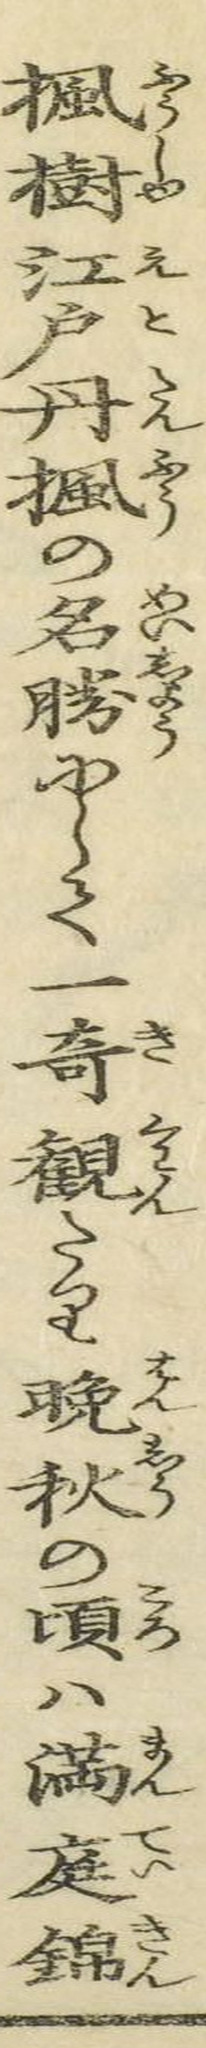楓樹江戸丹楓の名勝にして一奇観たり晩秋の頃は満庭錦
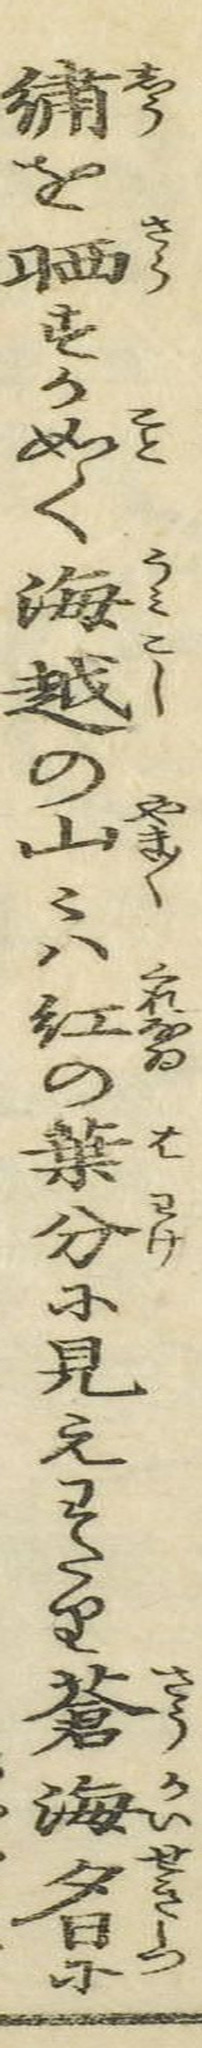繍を晒すか如く海越の山々は紅の葉分に見えわたり蒼海夕日に
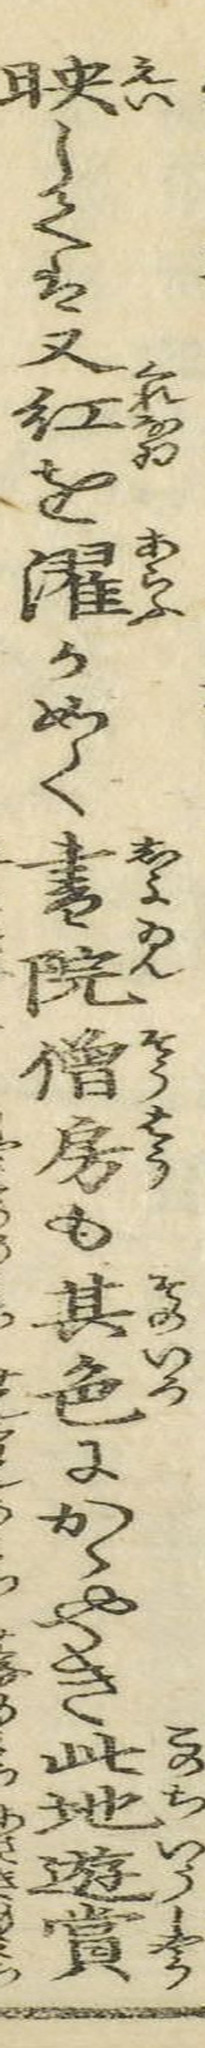映しては又紅を濯か如く書院僧坊も其色にかゝやき此地遊賞
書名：江戸名所図会 20巻 巻之4
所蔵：東京学芸大学教育コンテンツアーカイブ
